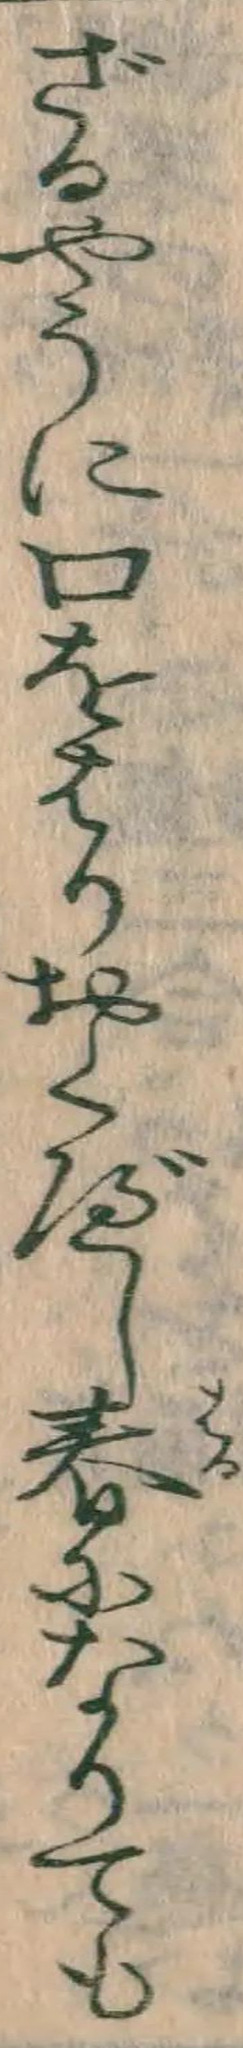ざるやうに口をはりおくべし春になりても
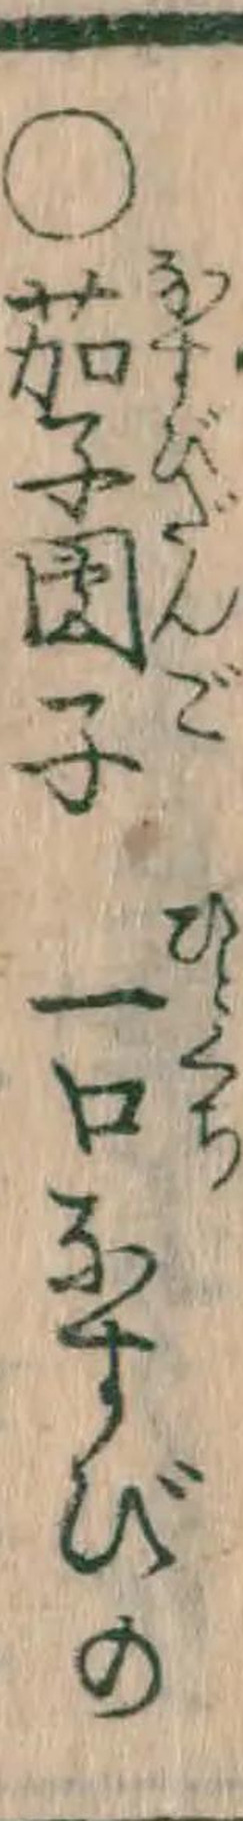○茄子団子一口なすびの
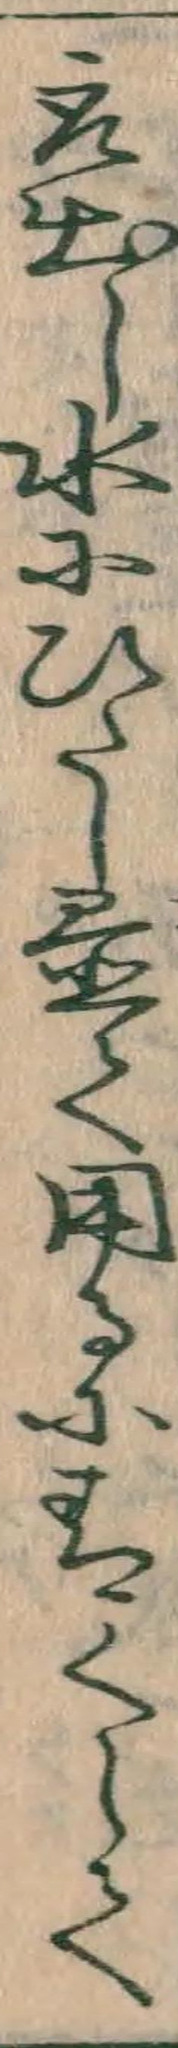取出し水にひたし置て用るに青くして
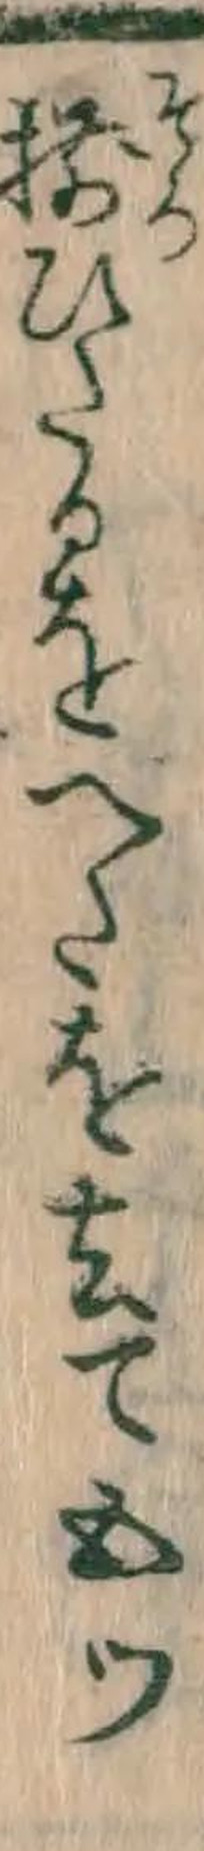揃ひたるをへたを去て五ッ
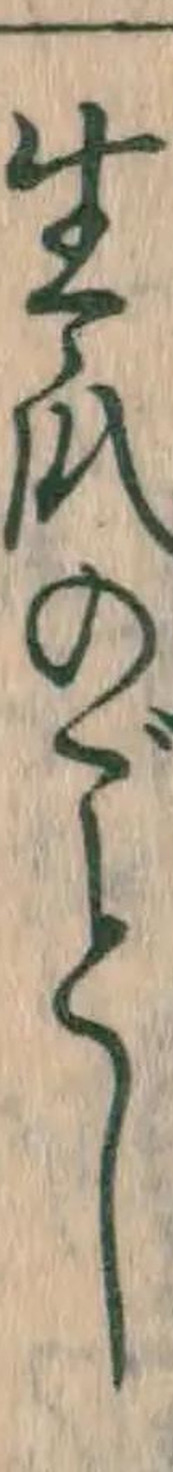生瓜のごとし
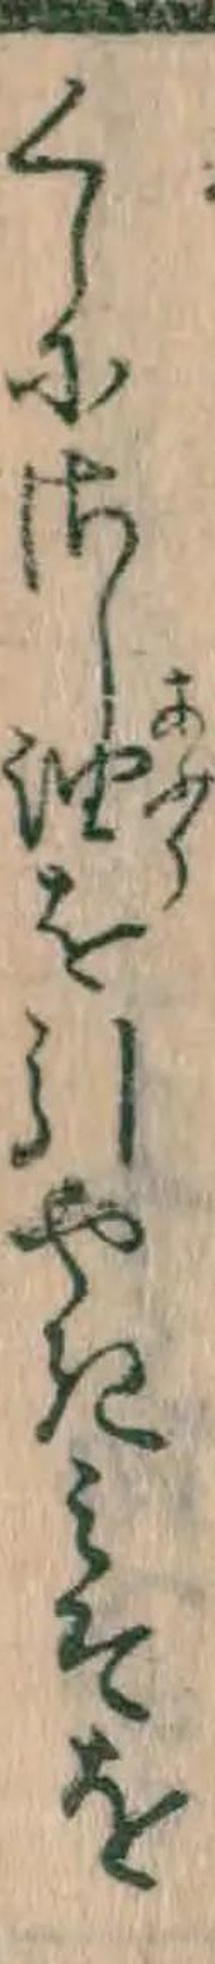くしにさし油を引やきみそを
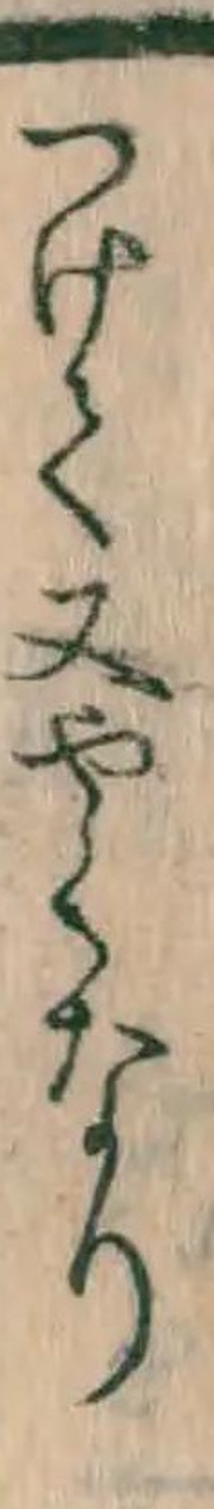つけて又やくなり
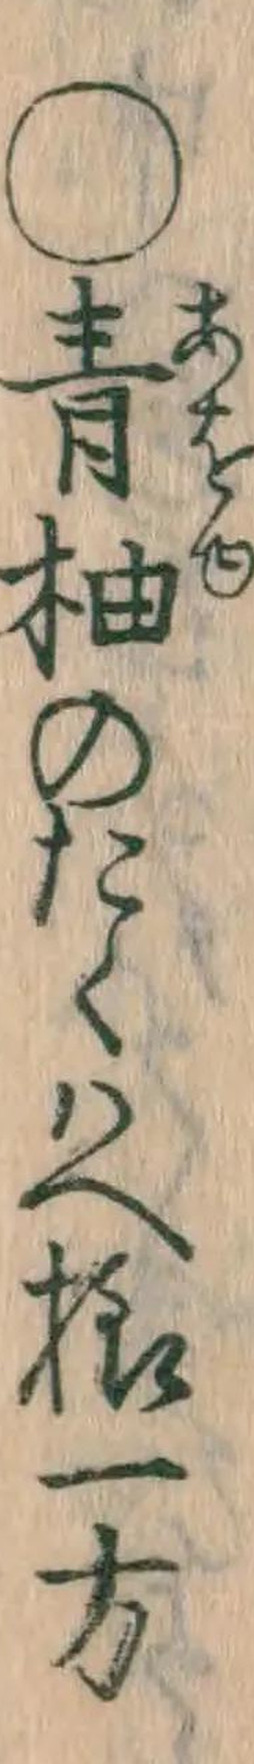○青柚のたくはへ様一方
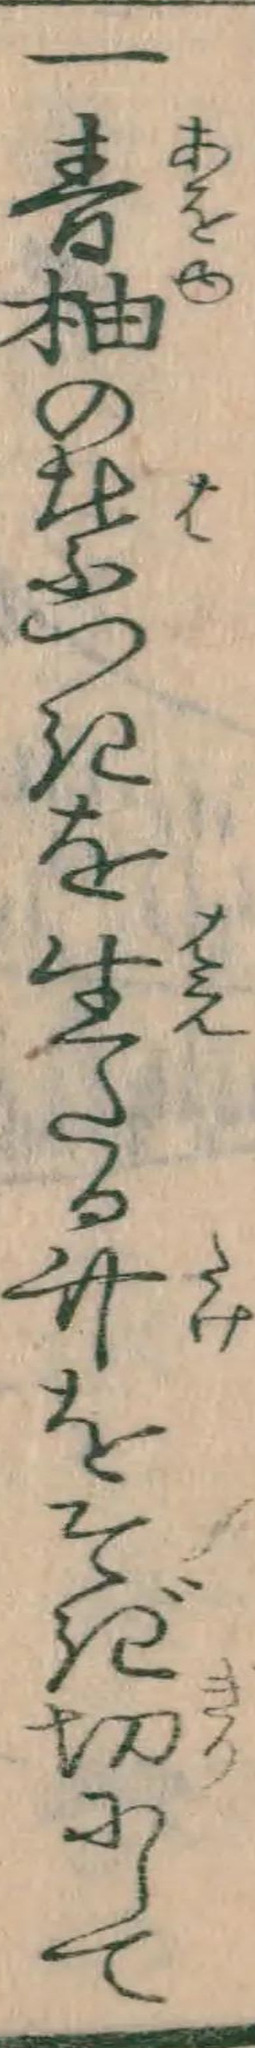一青柚の葉つきを生たる竹をそぎ切にして
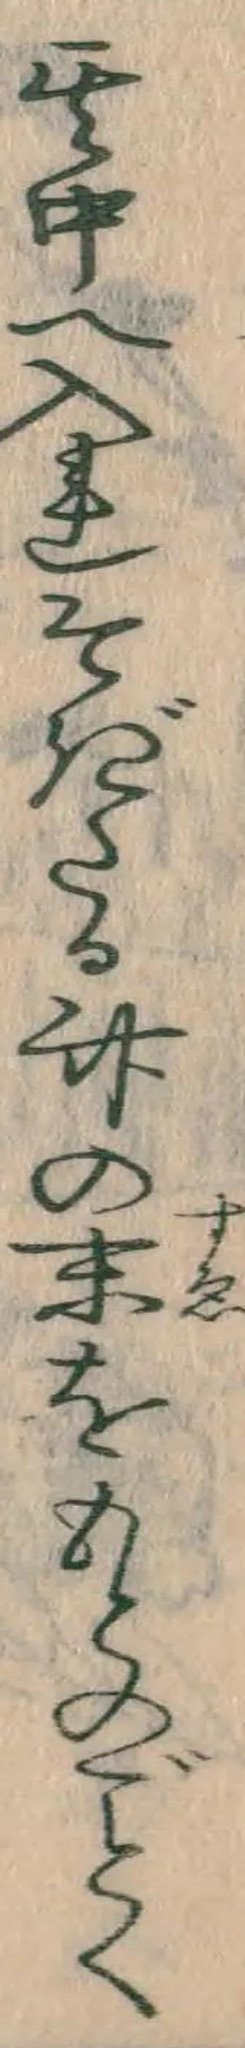其中へ入れそぎたる竹の末をもとのごとく
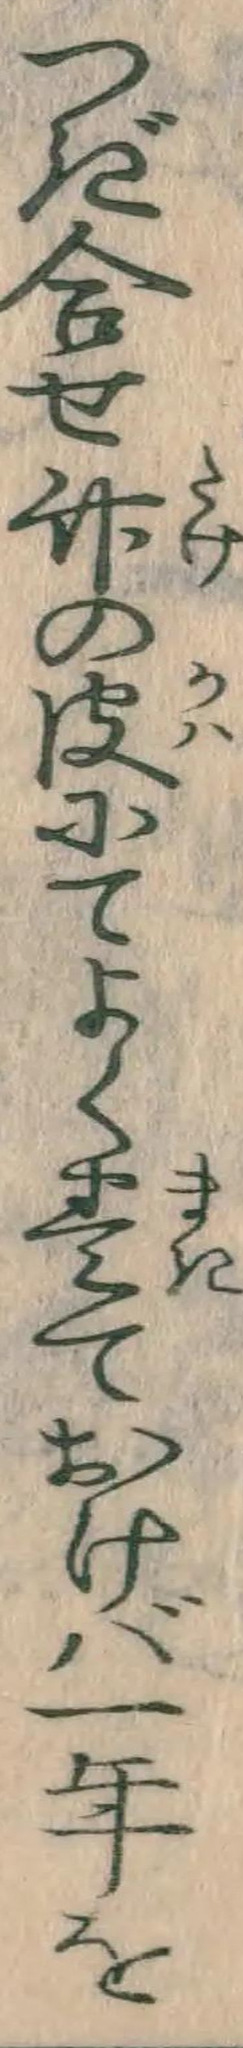つぎ合せ竹の皮にてよく巻ておけば一年を
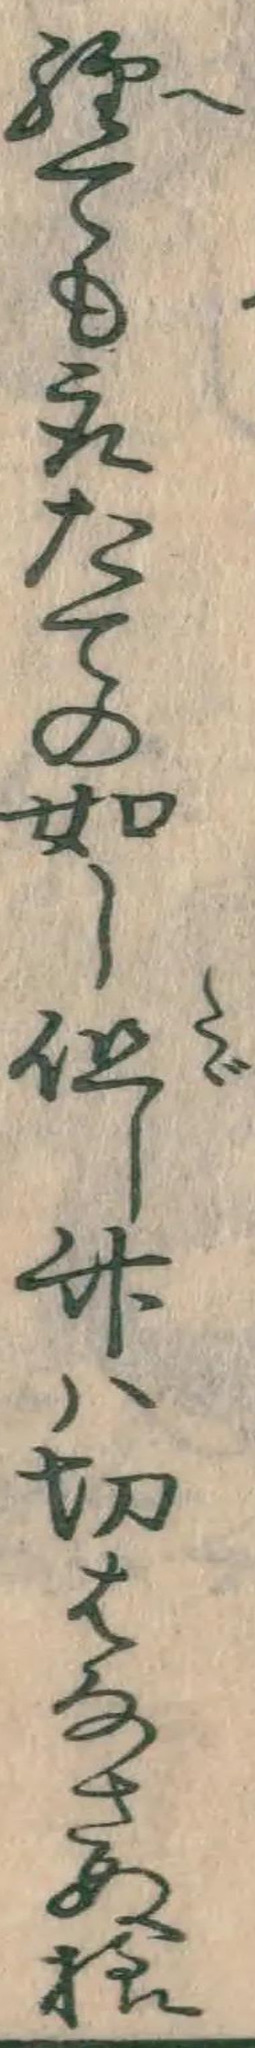経ても取たての如し但し竹は切はなさぬ様
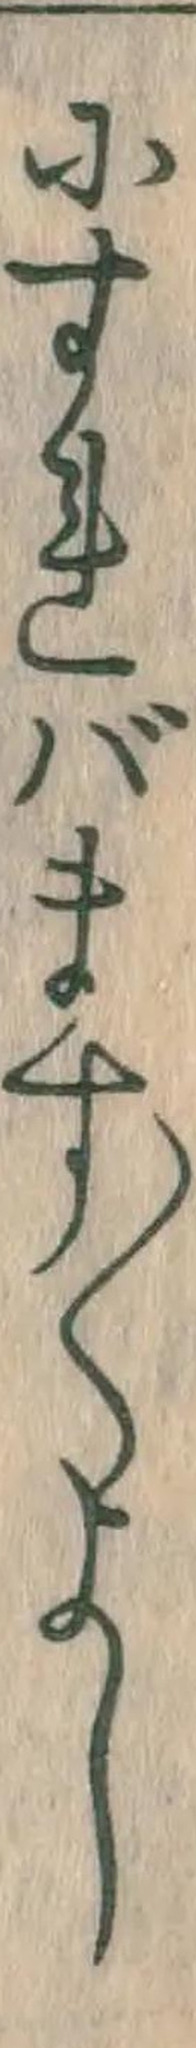にすればます〳〵よし
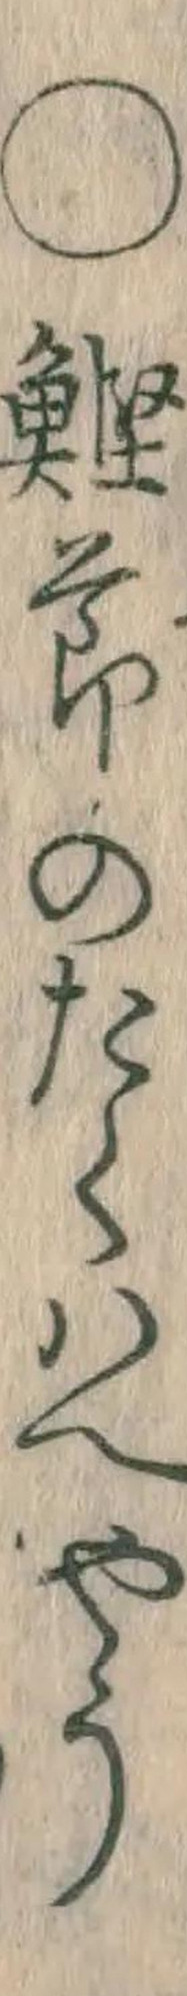○鰹節のたくはへやう
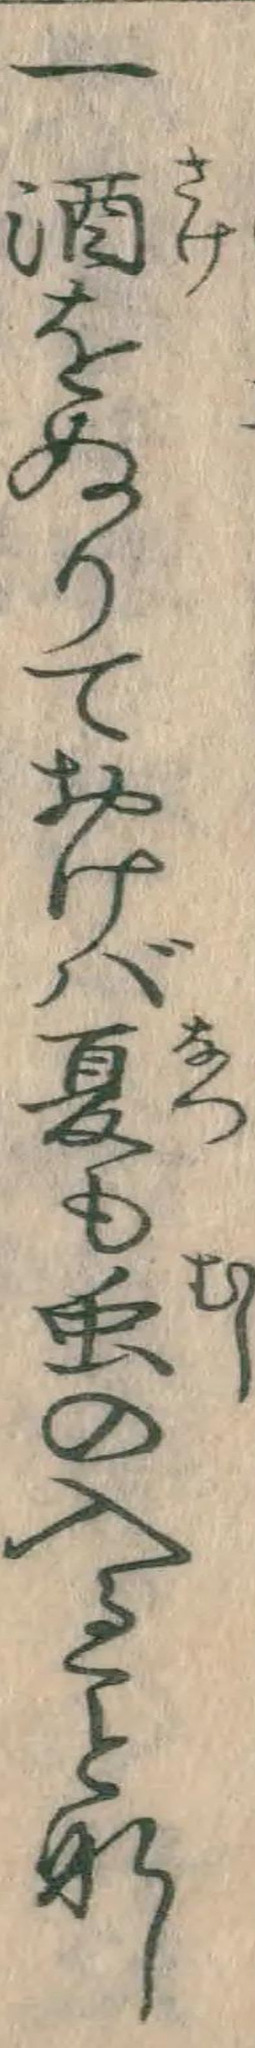一酒をぬりておけば夏も虫の入ることなし
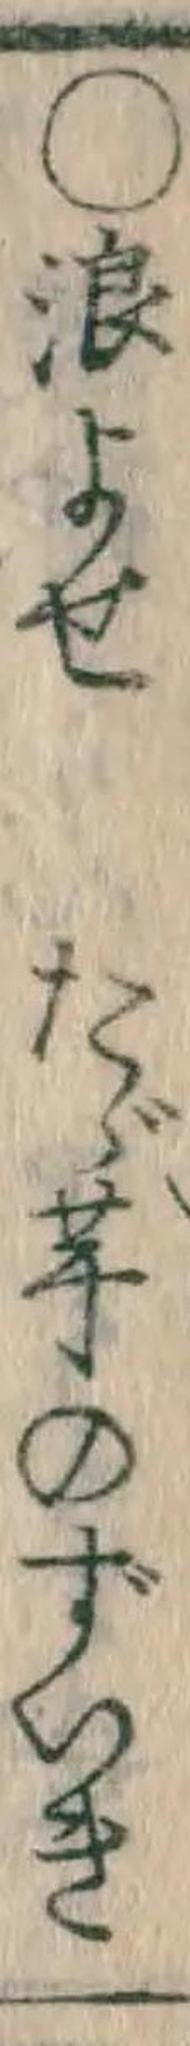○浪よせたゞ芋のずいき
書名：広益秘事大全 3巻. [5]
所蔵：国立国会図書館 National Diet Library, JAPAN
